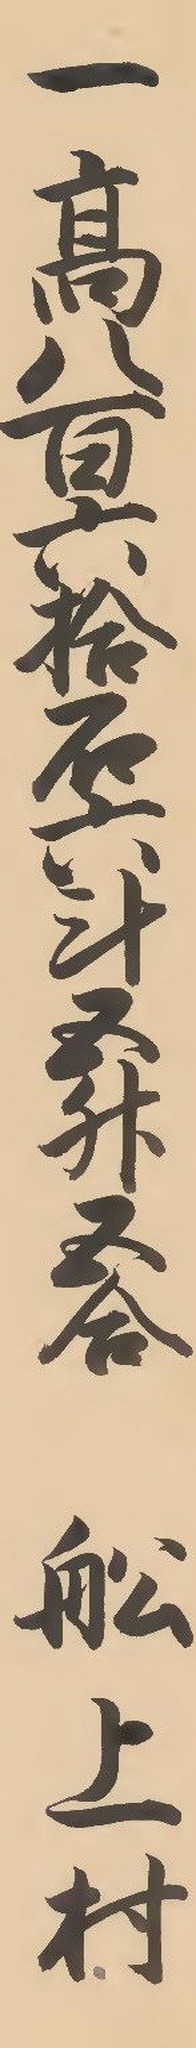一髙八百六拾石六斗五升五合舩上村
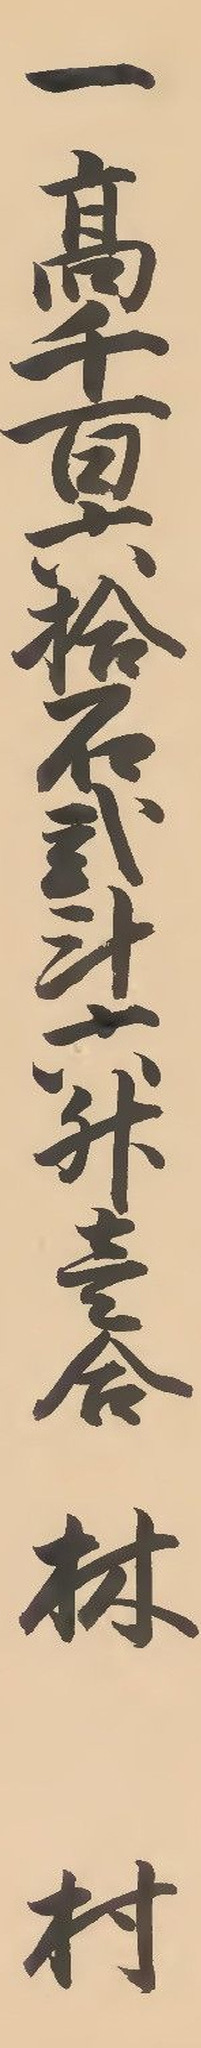一髙千百六拾石弐斗六升壱合林村
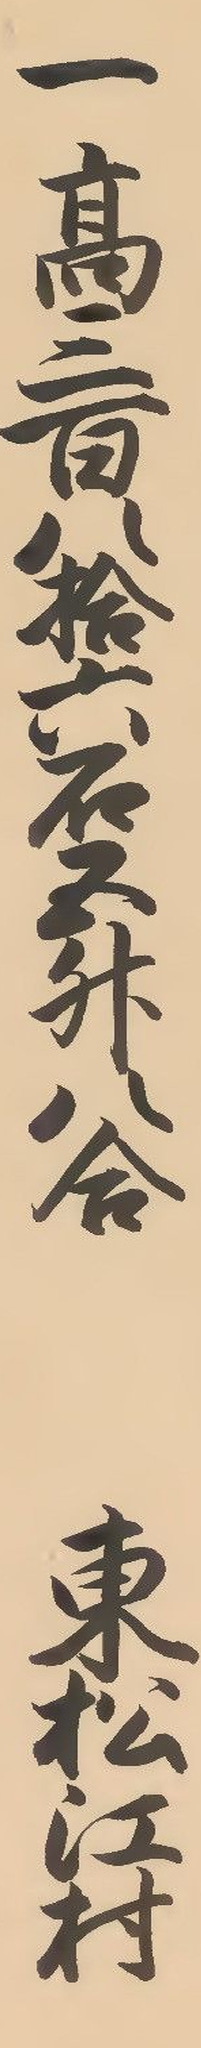一髙三百八拾六石五升八合東松江村
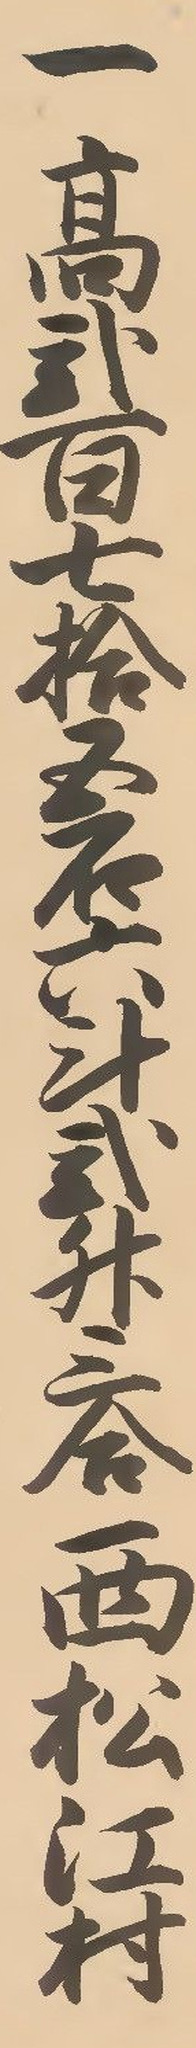一髙弐百七拾五石六斗弐升三合西松江村
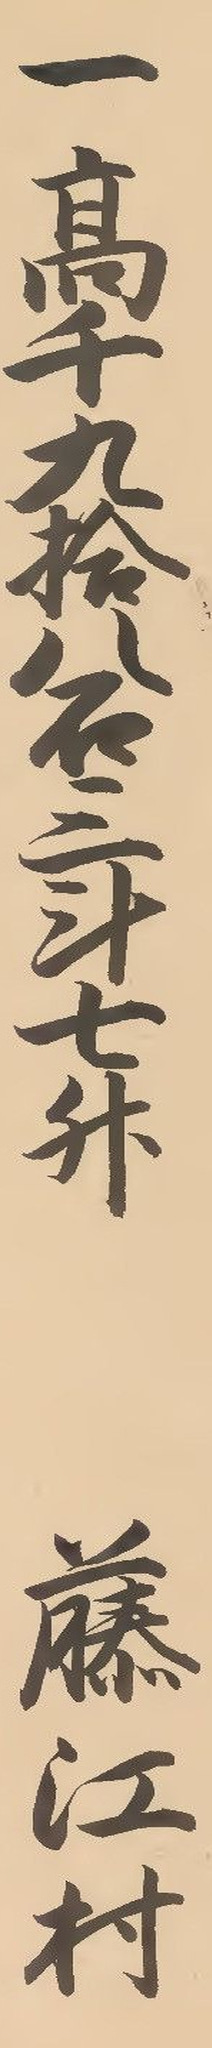一髙千九拾八石三斗七升藤江村
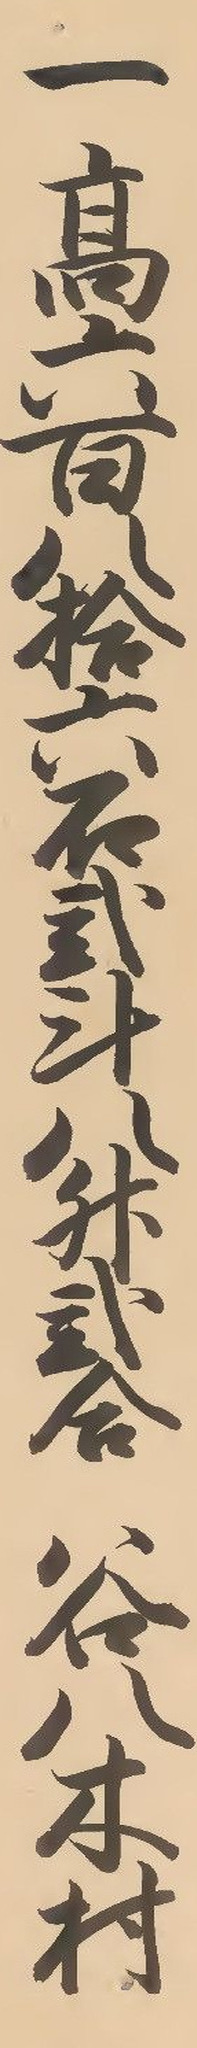一髙六百八拾六石弐斗八升弐合谷八木村
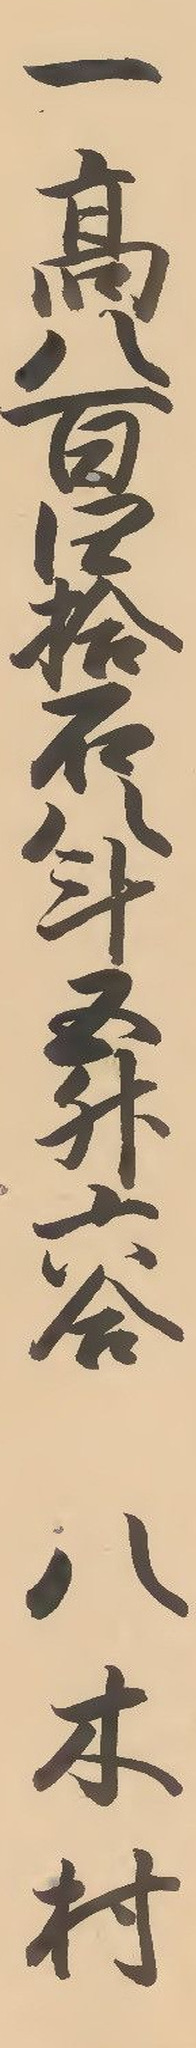一髙八百四拾石八斗五升六合八木村

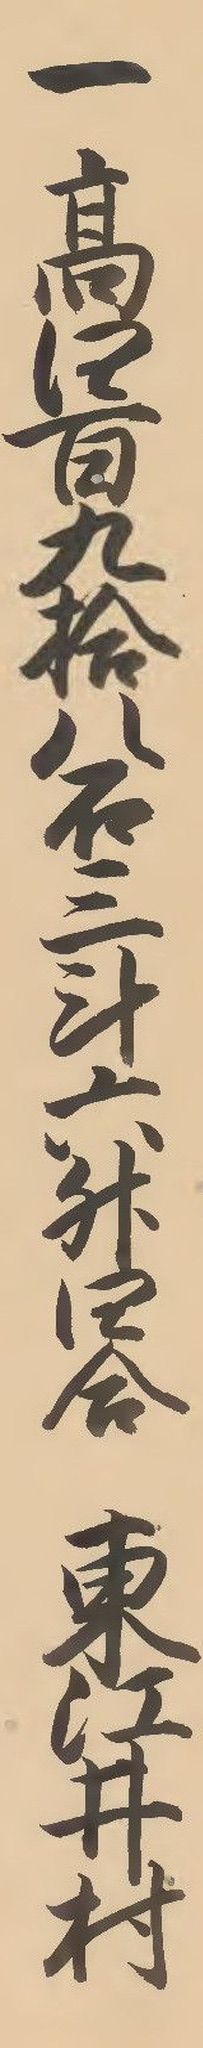一髙四百九拾八石三斗六升四合東江井村
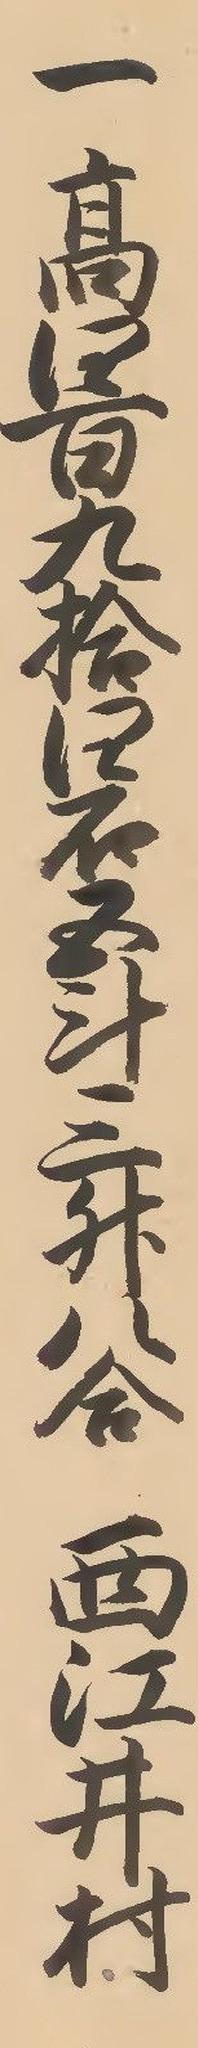一髙四百九拾四石五斗三升八合西江井村
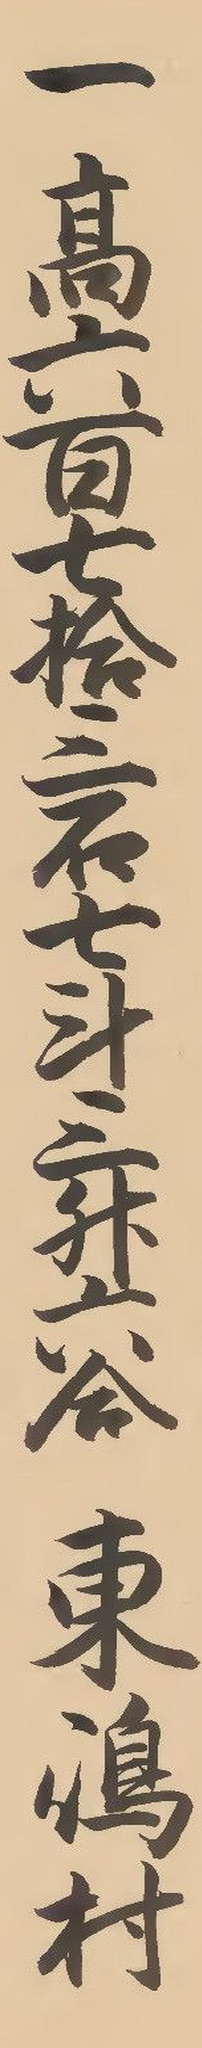一髙六百七拾三石七斗三升六合東嶋村
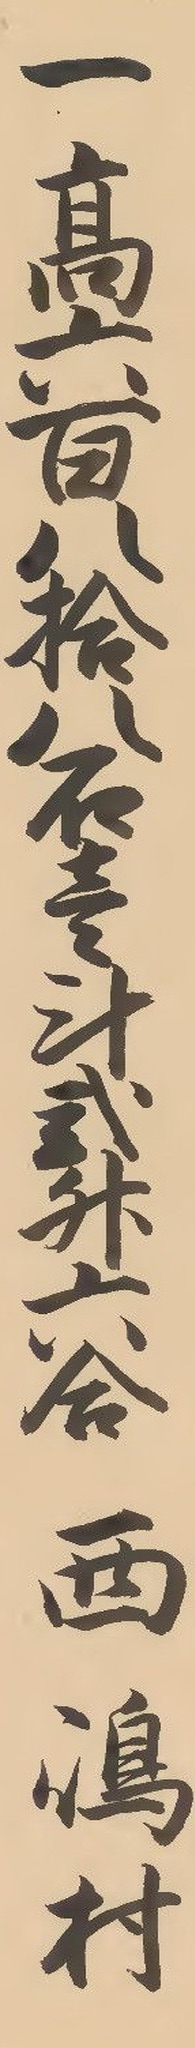一髙六百八拾八石壱斗弐升六合西嶋村
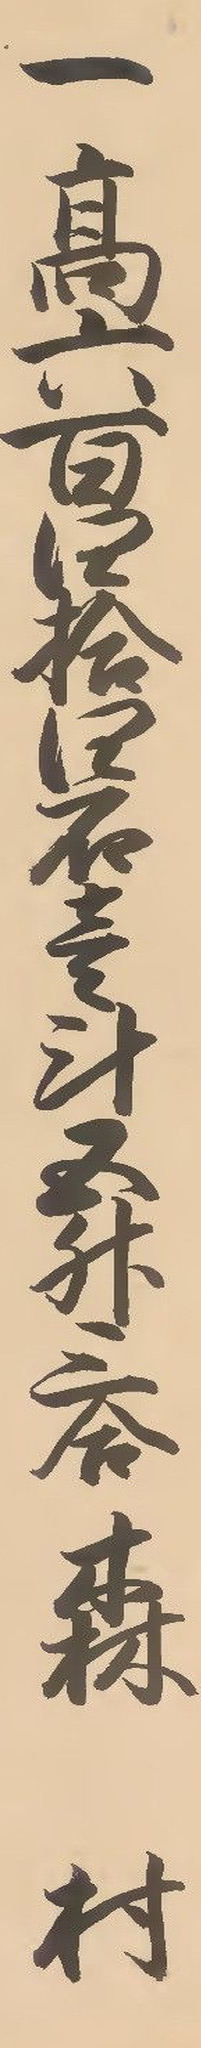一髙六百四拾四石壱斗五升三合森村
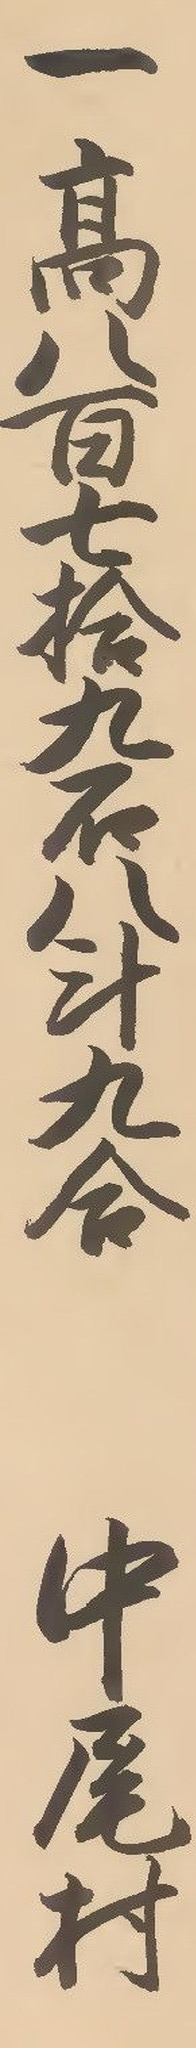一髙八百七拾九石八斗九合中尾村
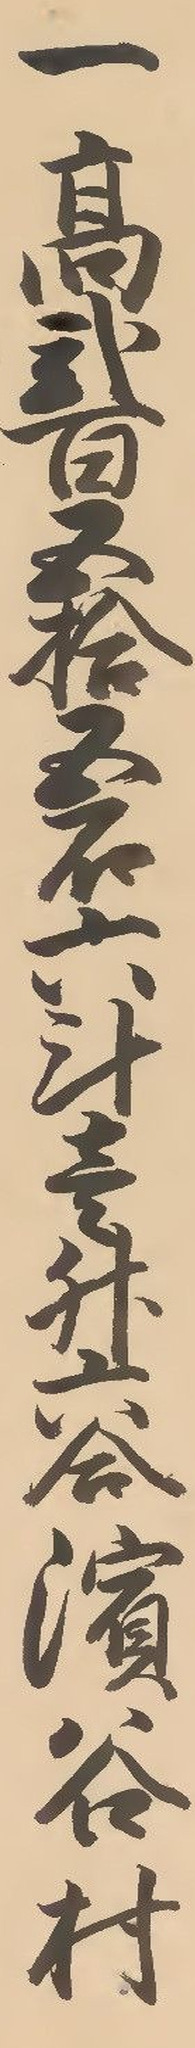一髙弐百五拾五石六斗壱升六合濱谷村
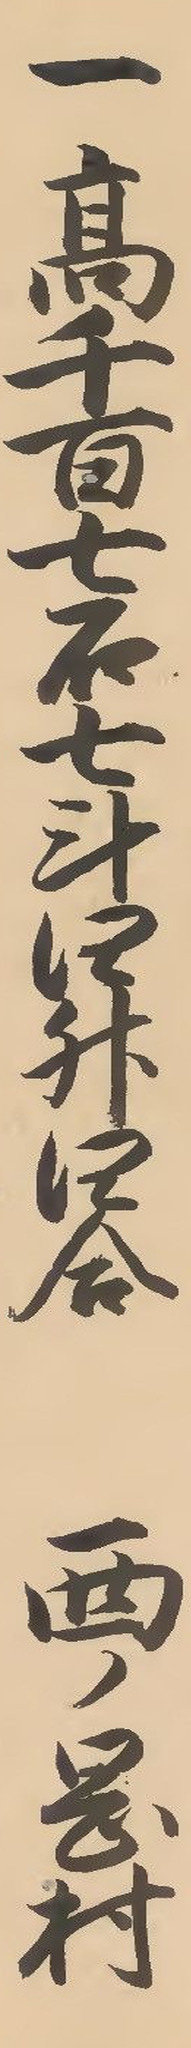一髙千百七石七斗四升四合西ノ岡村

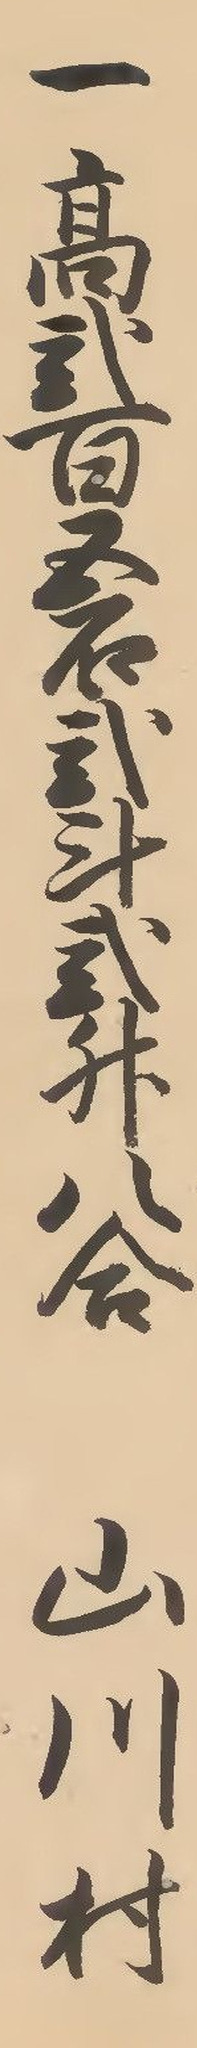一髙弐百五石弐斗弐升八合山川村
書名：播磨国郷帳
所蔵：国立公文書館 National Archives of Japan
